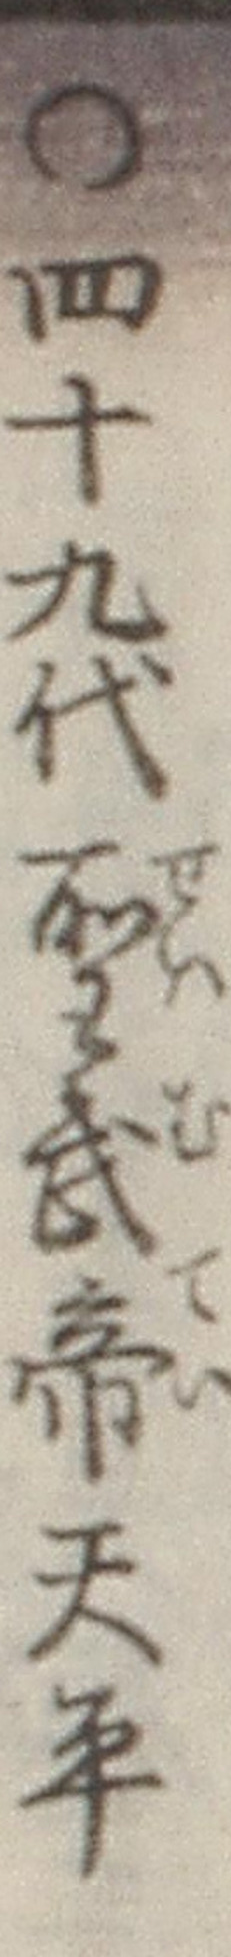◯四十九代聖武帝天平
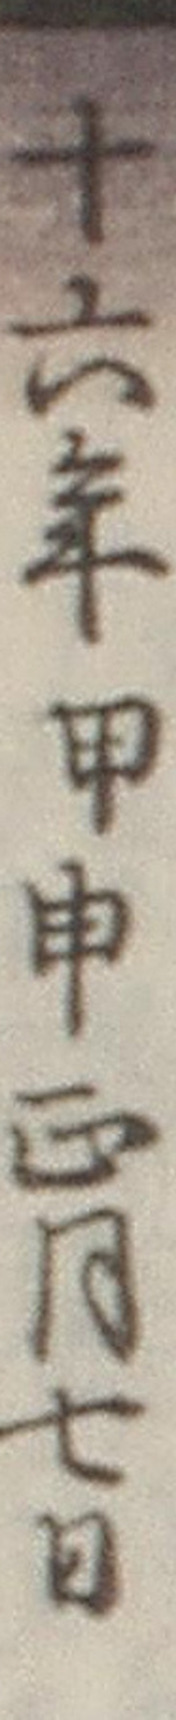十六年甲申四月七日
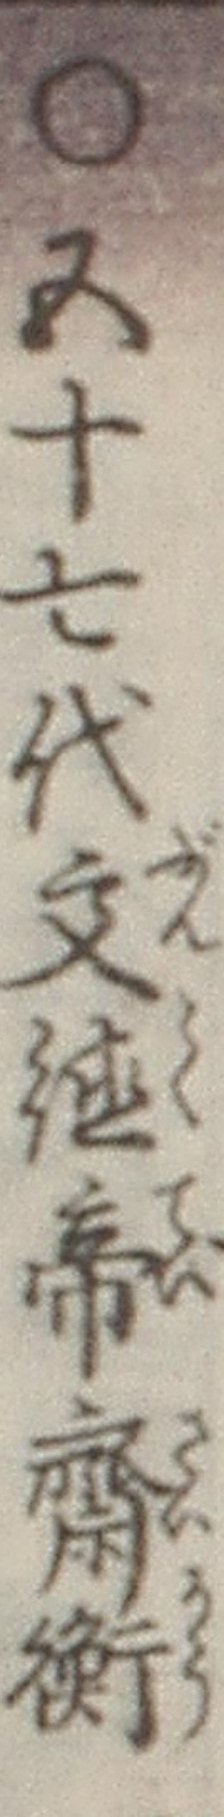◯五十七代文徳帝齋衡
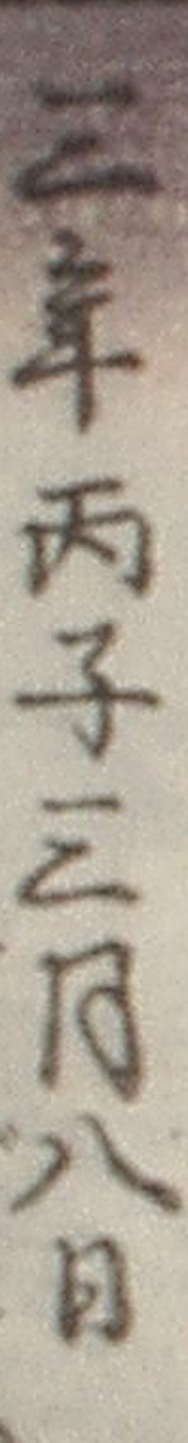三年丙子三月八日

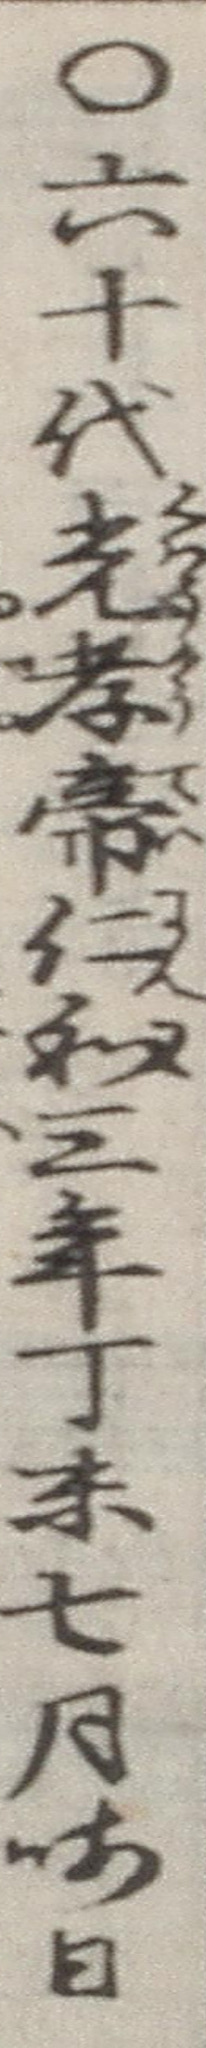○六十代光孝帝仁和三年丁未七月晦日
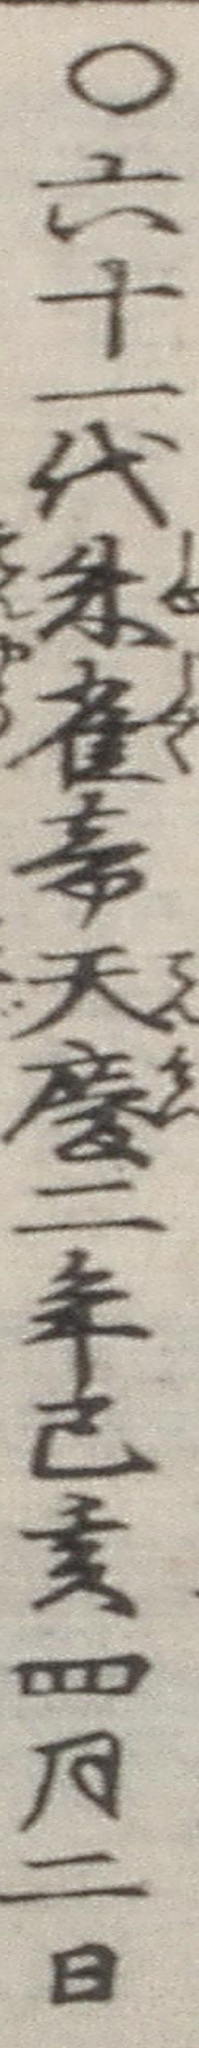○六十一代朱雀帝天慶二年己亥四月二日
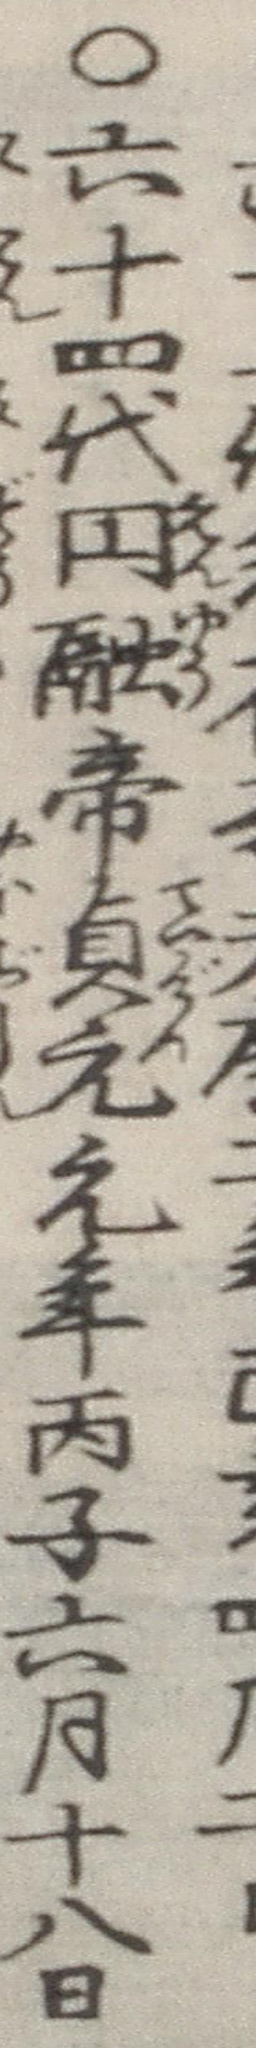○六十四代円融帝貞元元年丙子六月十八日
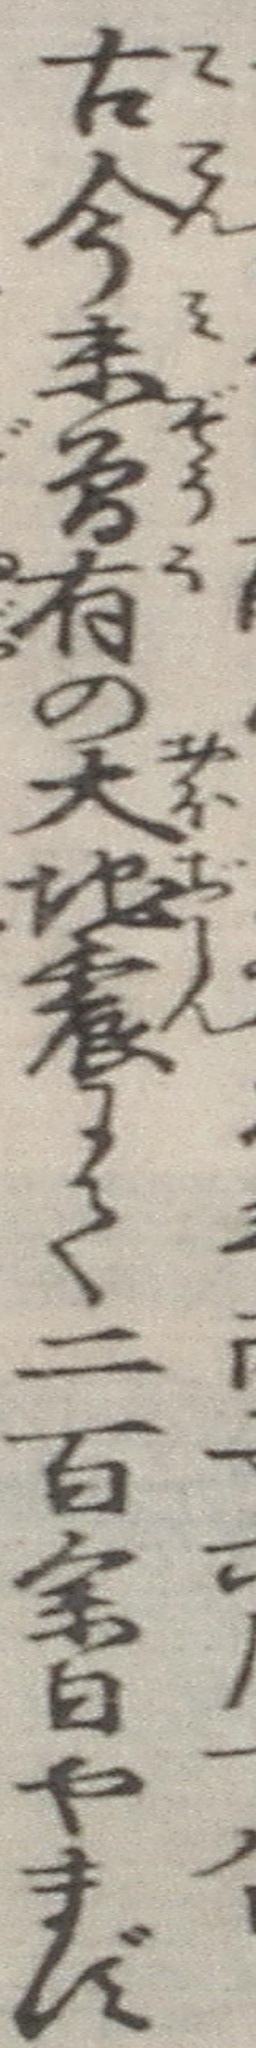古今未曾有の大地震にて二百余日やまず
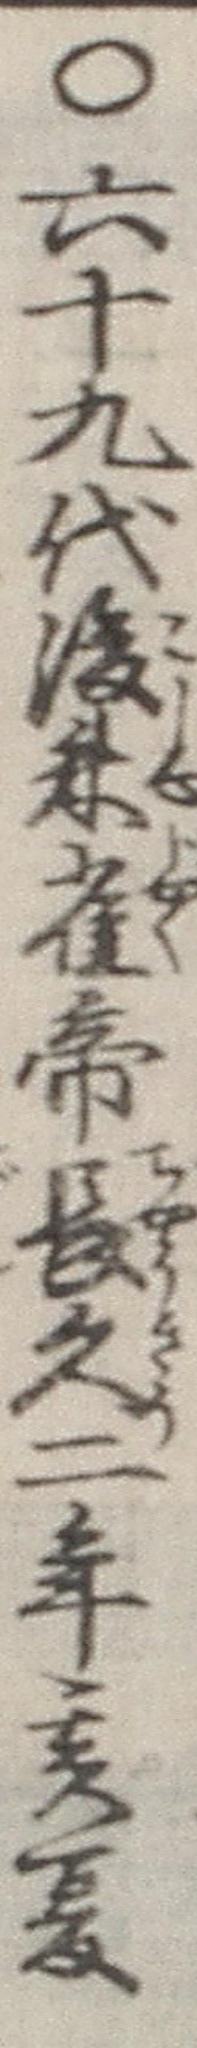○六十九代後朱雀帝長久二年亥夏
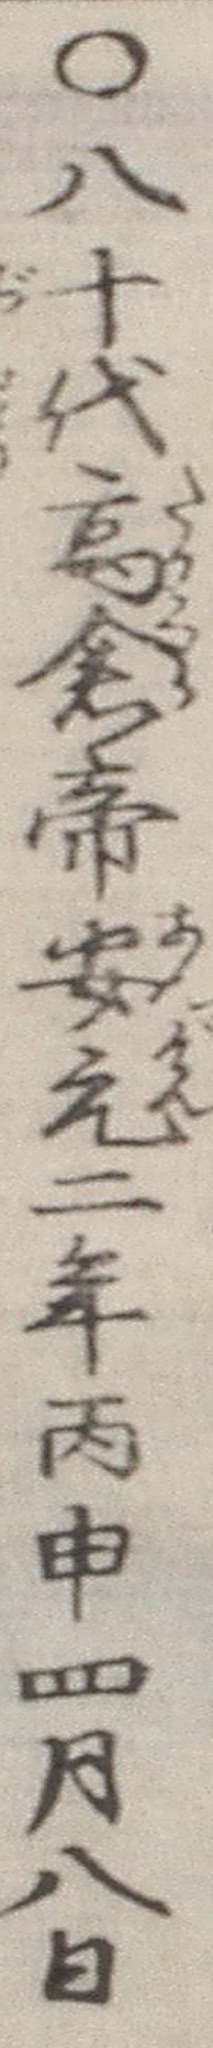○八十代高倉帝安元二年丙申四月八日
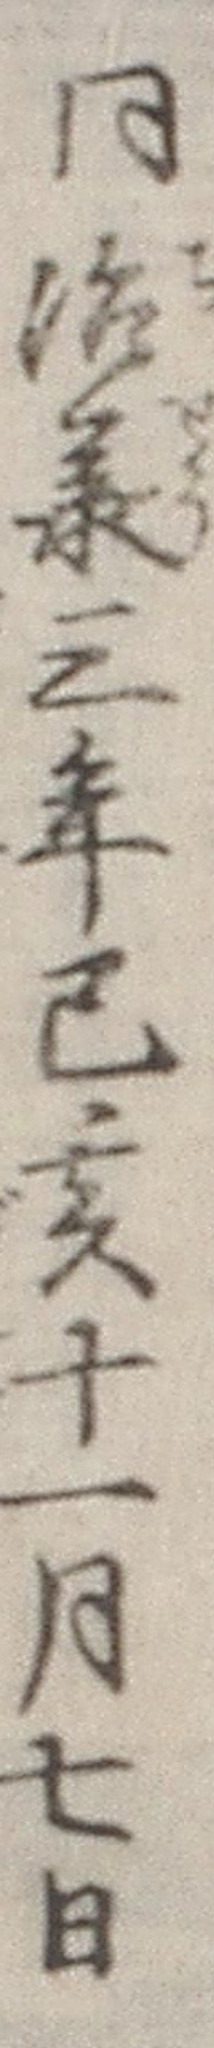同治承三年己亥十一月七日
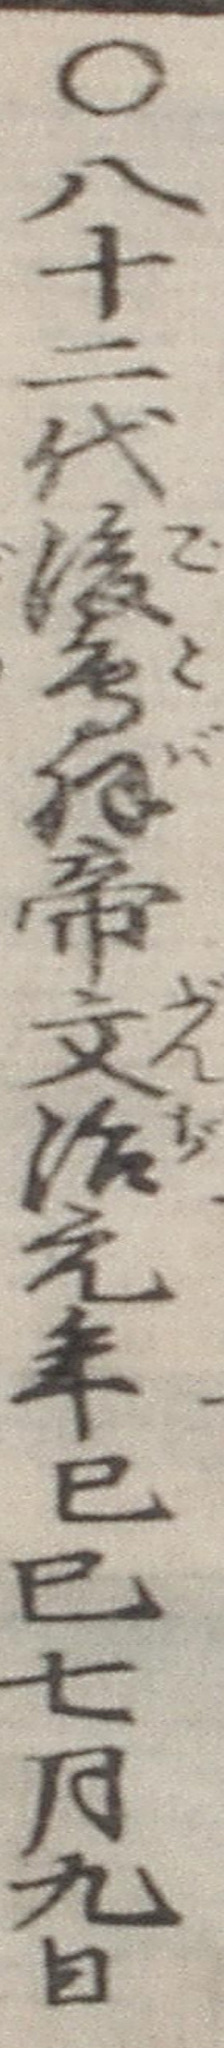○八十二代後鳥羽帝文治元年巳巳七月九日
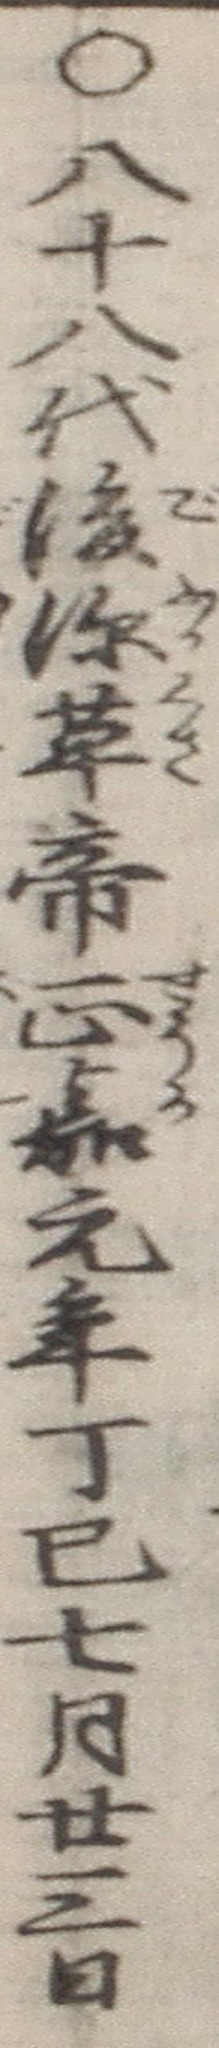○八十八代後深草帝正嘉元年丁巳七月廿三日
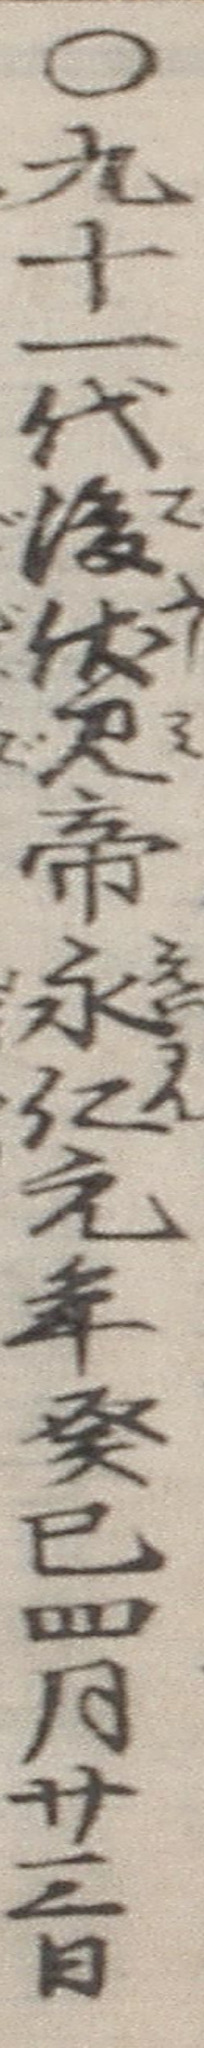○九十一代後伏見帝永仁元年癸巳四月廿三日
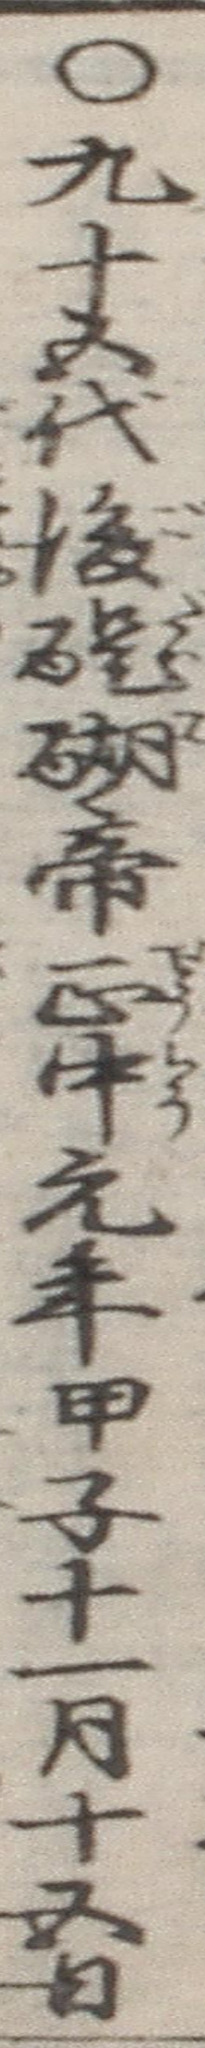○九十五代後醍醐帝正中元年甲子十一月十五日
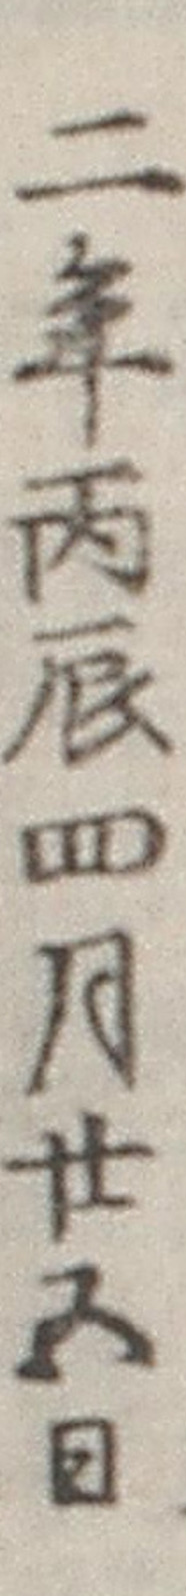二年丙辰四月廿五日
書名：諸國大地震年代記　末代噺種
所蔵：東京大学地震研究所図書室 Earthquake Research Institute Library, The University of Tokyo, JAPAN
